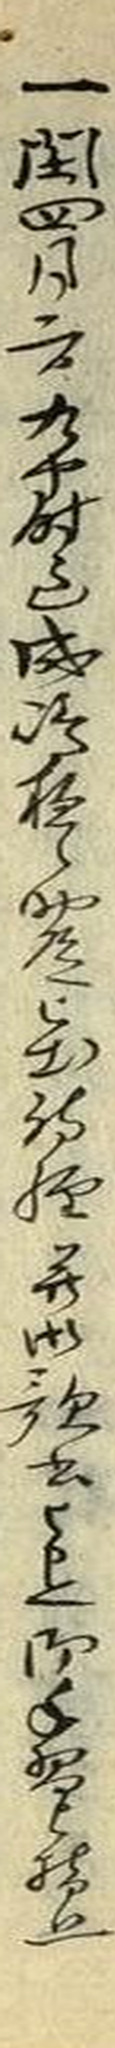一閏四月二日九半時過成嶋桓之助殿被出詩経并御歌書被申上御手習被指上
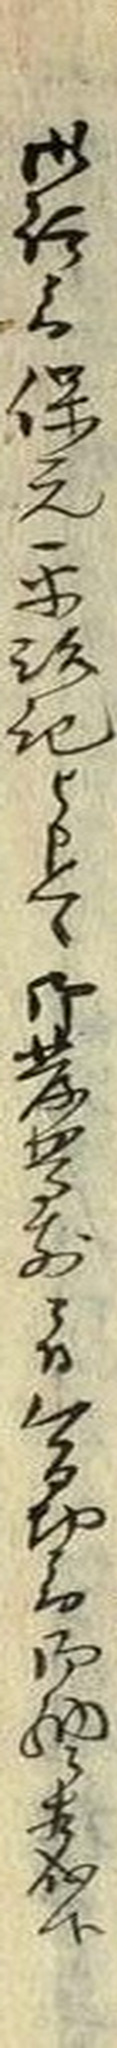御仰ニ而保元平治記被申上御発駕前ニ付今日切ニ而御納被相成候
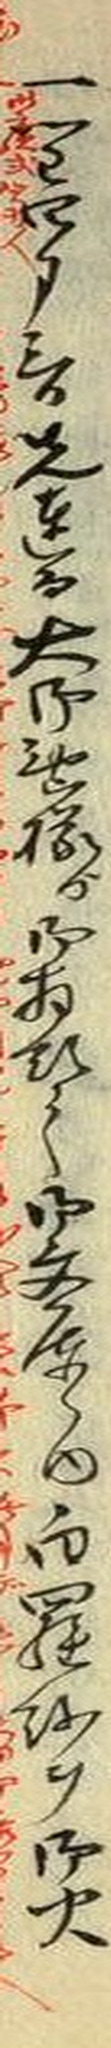一閏四月三日先達而大御台様ゟ御拝領之御文庫之内白羅紗ヲ御火
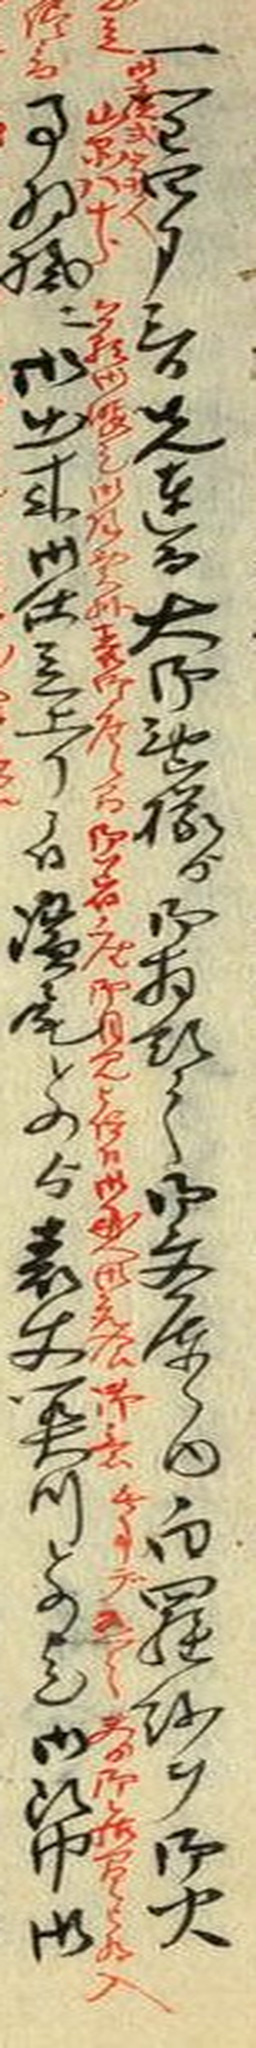事羽織ニ御出来御仕立上り候ニ付浜尾とのゟ表使関川との迄御頭巾
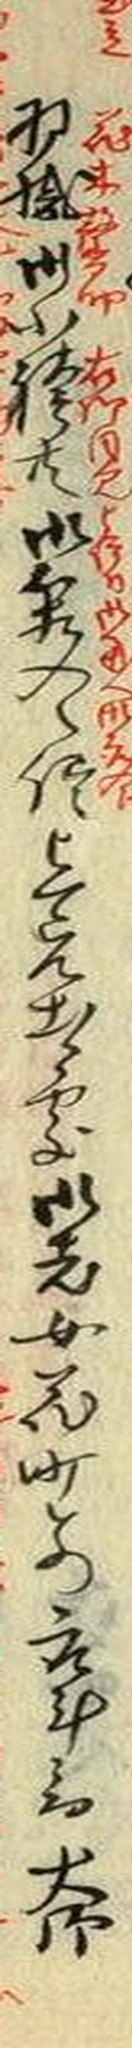羽織御小袴共御箱入之儘被差出候処御老女花町との取斗ニ而大御
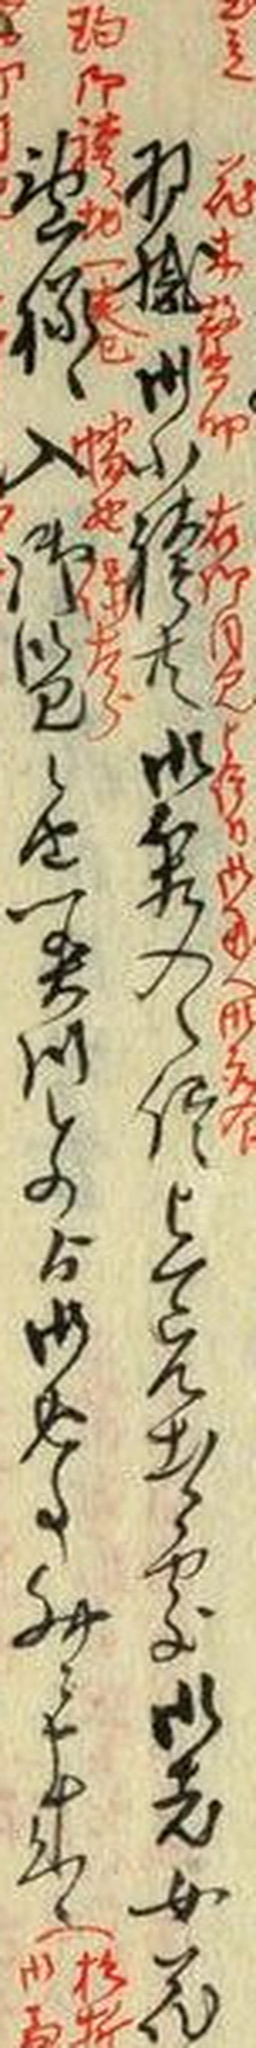台様へ入御覧候由関川とのゟ御返事文ニ申来候
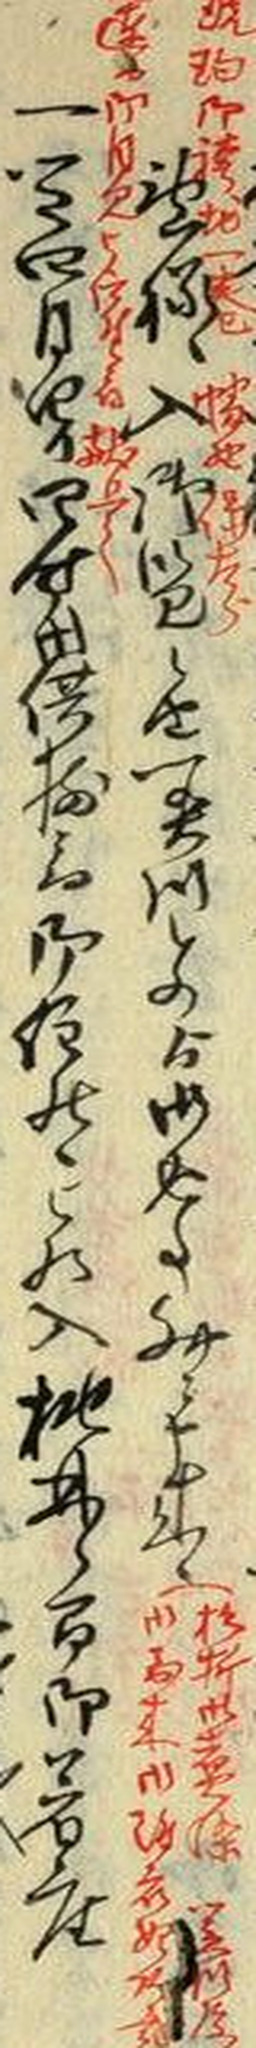一閏四月四日四時御供揃ニ而御住居へ被為入桃林之間御着座
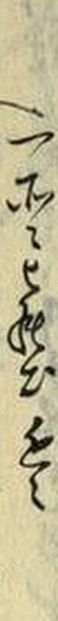一所ニ被罷出近々
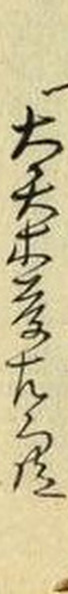大矢木藤左衛門殿
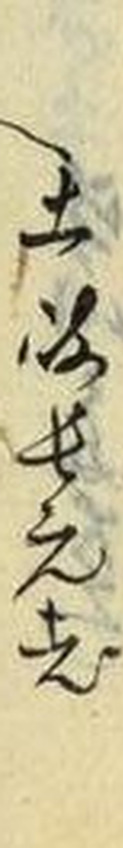土岐長元老
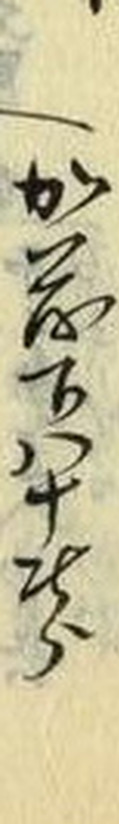加茂下八十次郎
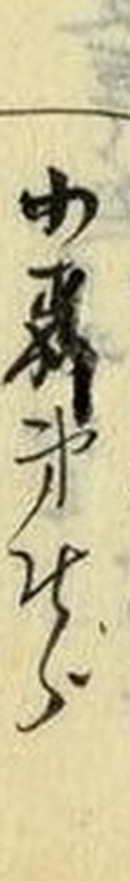小森第次郎
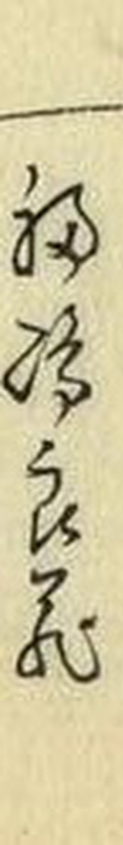福嶋良蔵
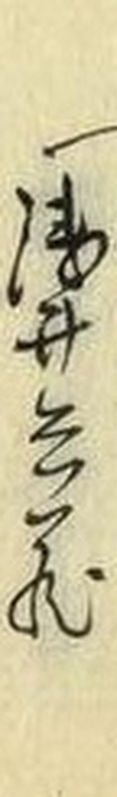浅井兵蔵
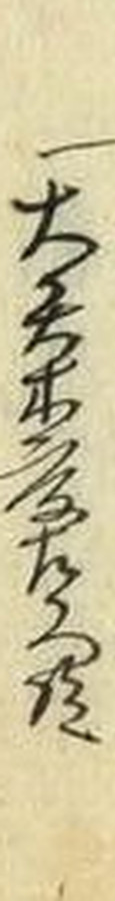大矢木藤左衛門殿
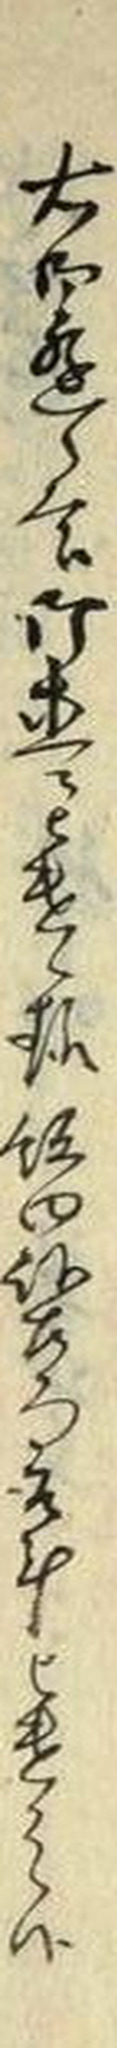右御逢候節御直ニ被遣候趣飯田作左衛門取斗被遣之候
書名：少傅日録抄（斉善付側向頭取日記、江戸并道中、初入在国、逝去後…
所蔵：福井県文書館 Fukui Prefectural Archives
